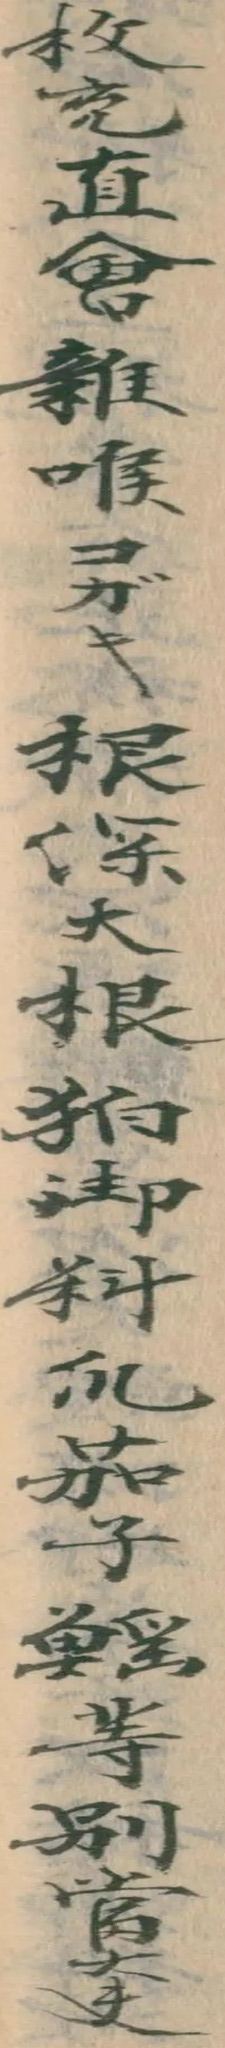枚充直会雑喉コガキ根深大根狛御料瓜茄子鰩等別当大夫
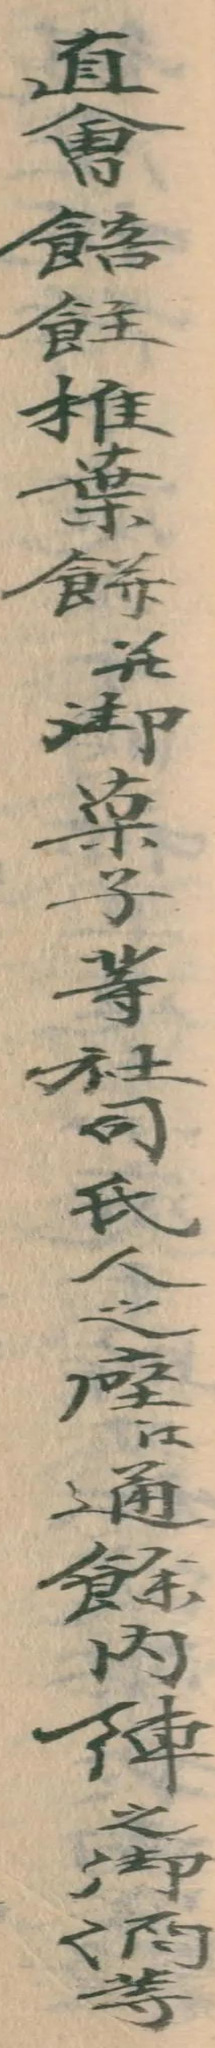直会餢飳椎葉餅并御菓子等社司氏人之座江通余内陣之御酒等
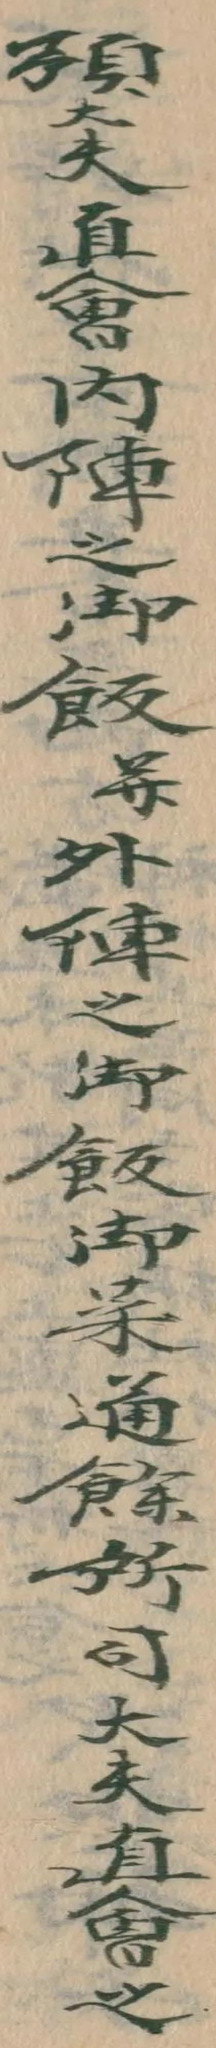預大夫直会内陣之御飯并外陣之御飯御菜通余所司大夫直会之
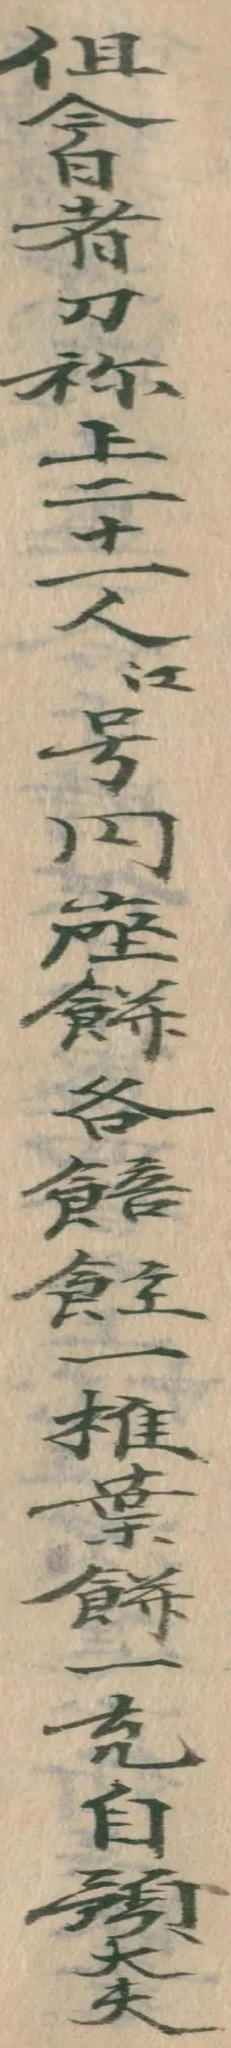但今日者刀祢上二十一人江号円座餅各餢飳一椎葉餅一充自預大夫
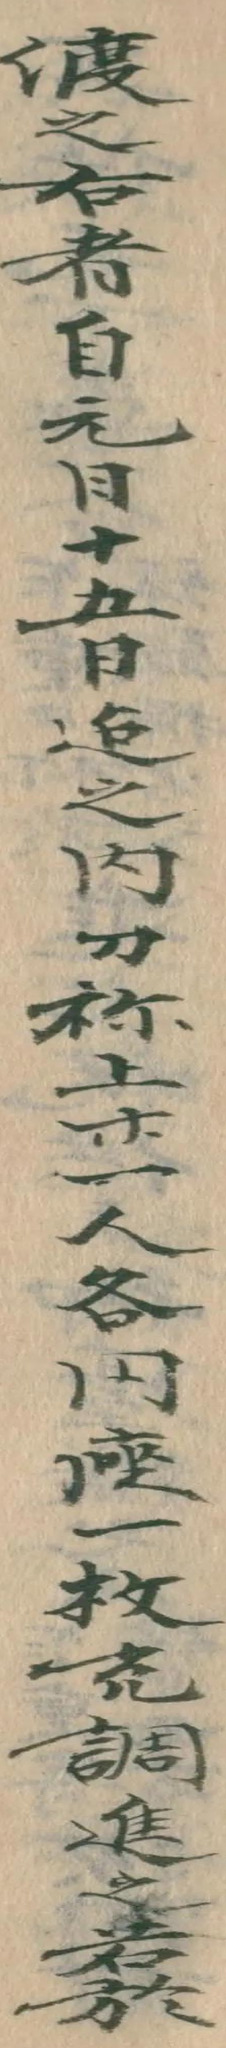渡之右者自元日十五日迄之内刀祢上廿一人各円座一枚充調進之若於
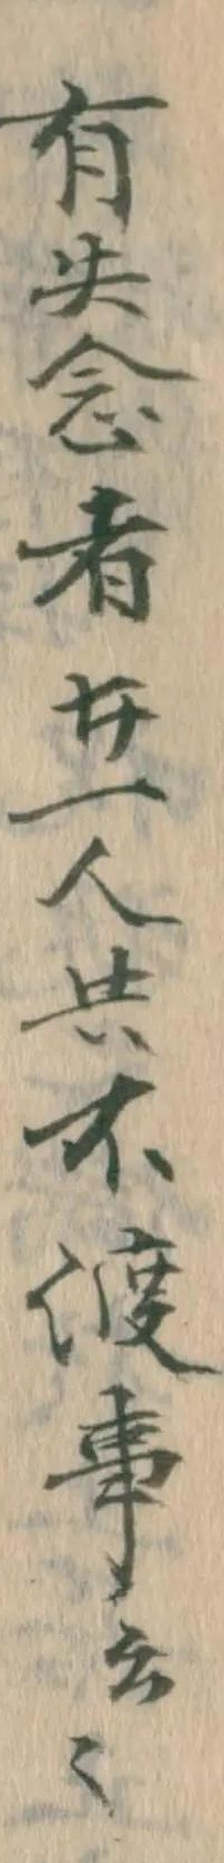有失念者廿一人共不渡事云々

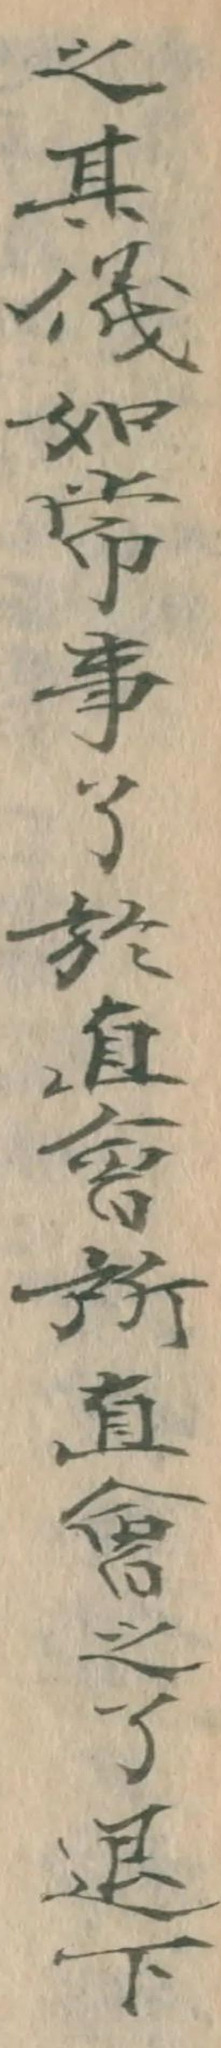之其儀如常事了於直会所直会之了退下
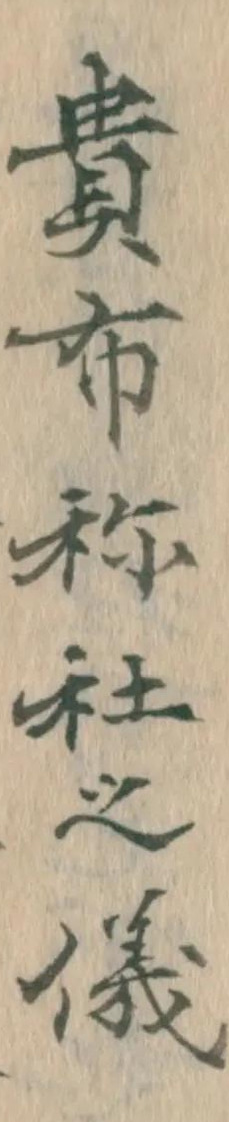貴ふね社之儀
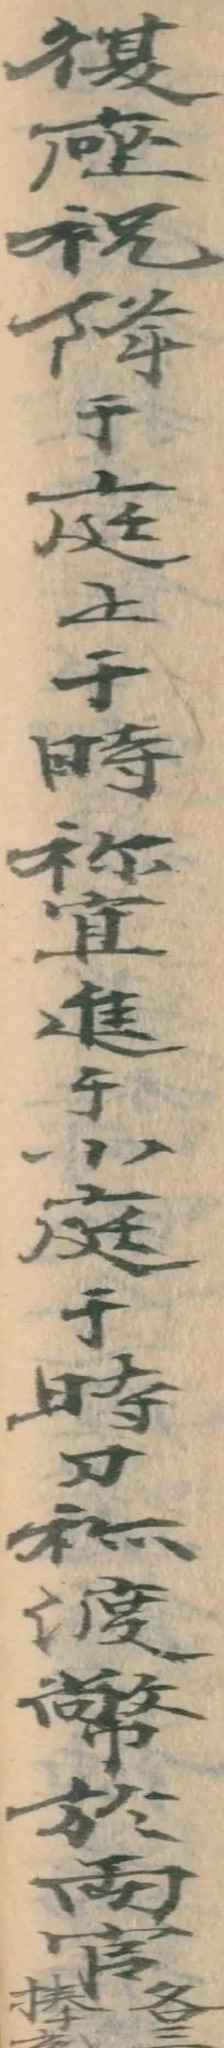復座祝降于庭上于時祢宜進于小庭于時刀祢渡幣於両官各三棒充
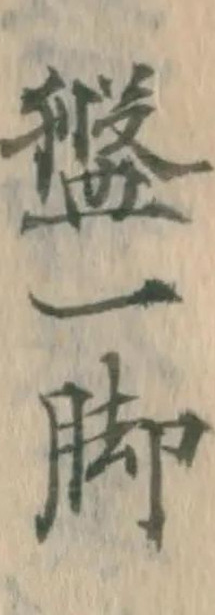盤一脚
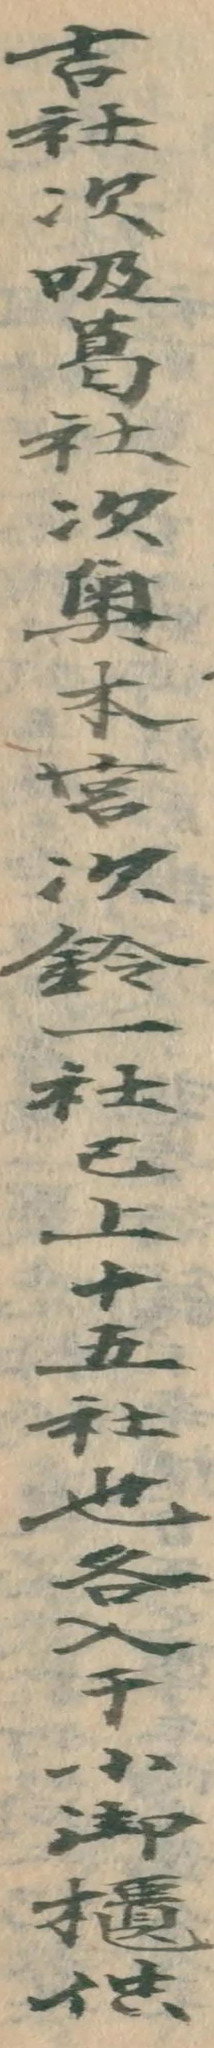吉社次吸葛社次奥本宮次鈴一社已上十五社也各入于小御櫃供

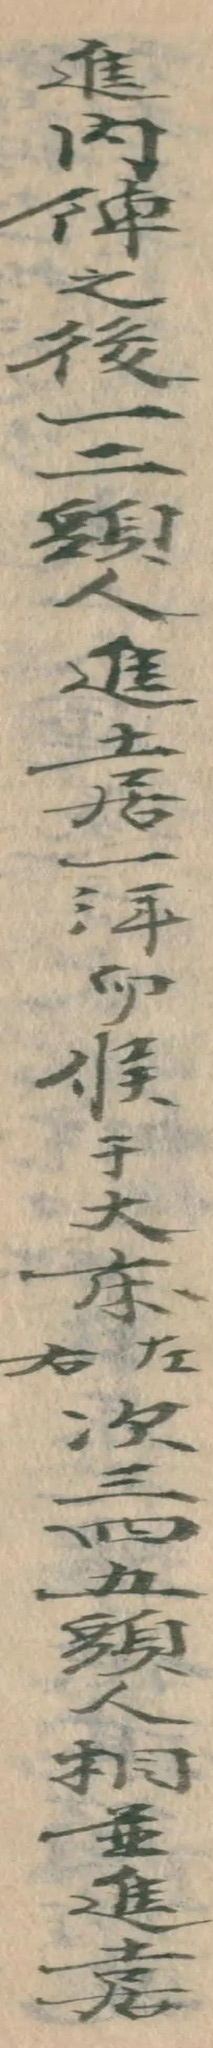進内陣之後一二頭人進土居一拝而候于大床左右次三四五頭人相並進土居
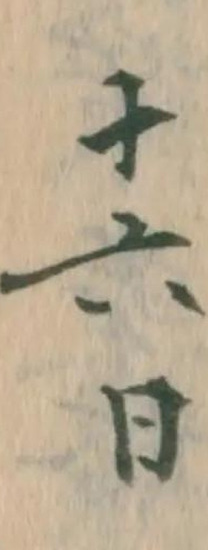十六日
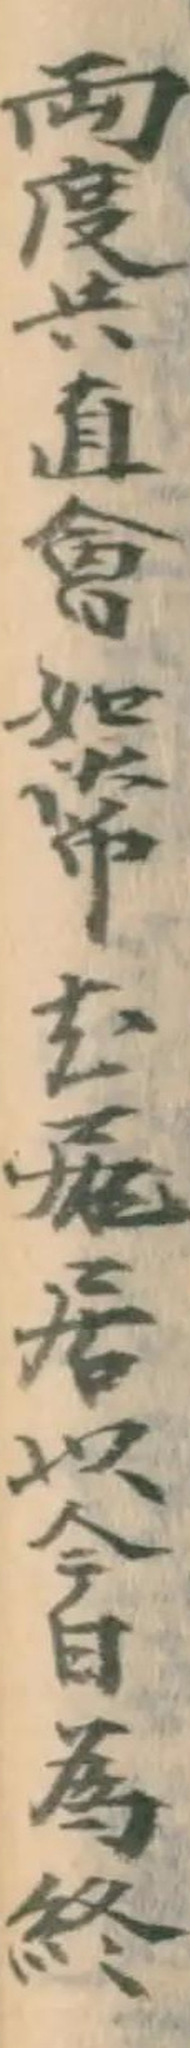両度共直会如常尤尻居以今日為終
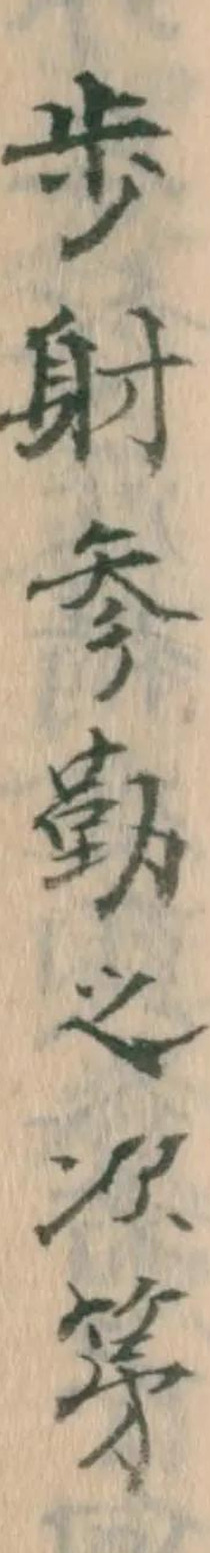歩射参勤之次第
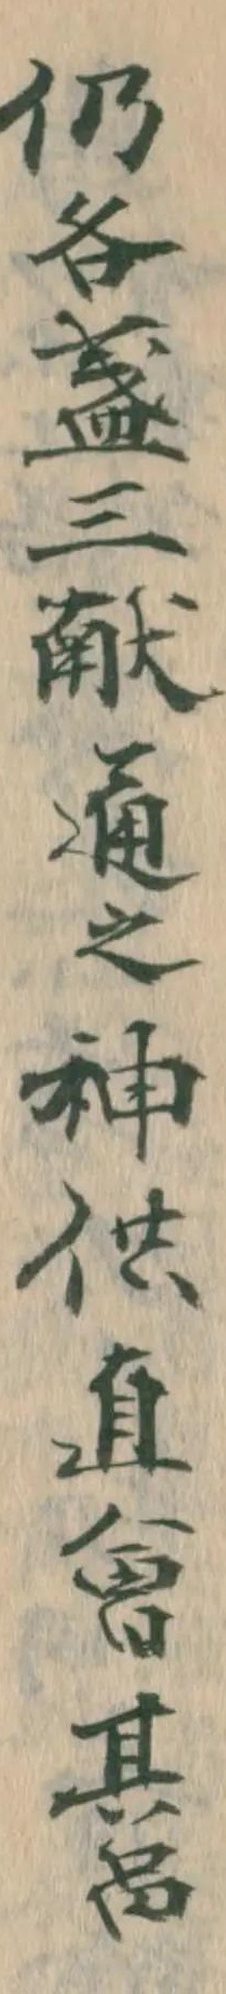仍各盞三献通之神供直会其品
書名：賀茂社記録. 第9冊
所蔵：国立国会図書館 National Diet Library, JAPAN
